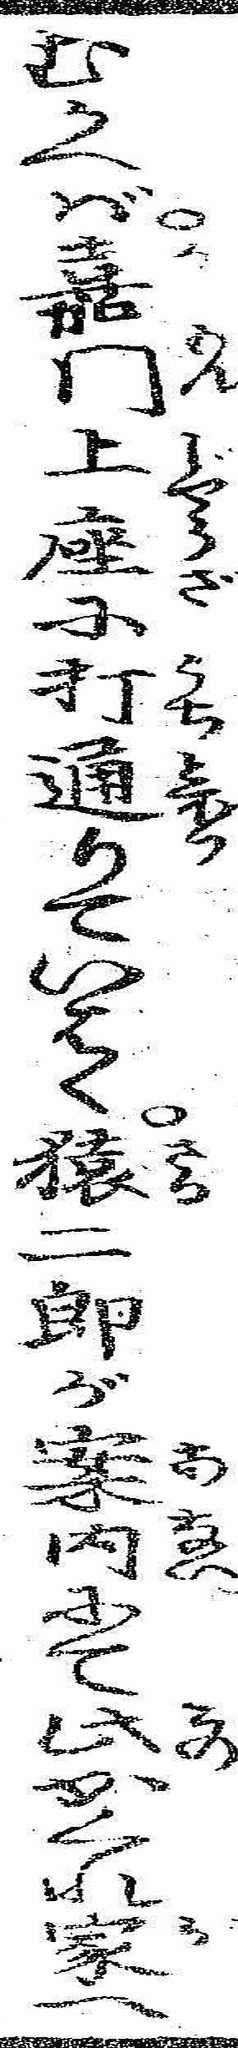むかへば。嘉門上座に打通りていはく。猿二郎が案内にて此かくれ家へ
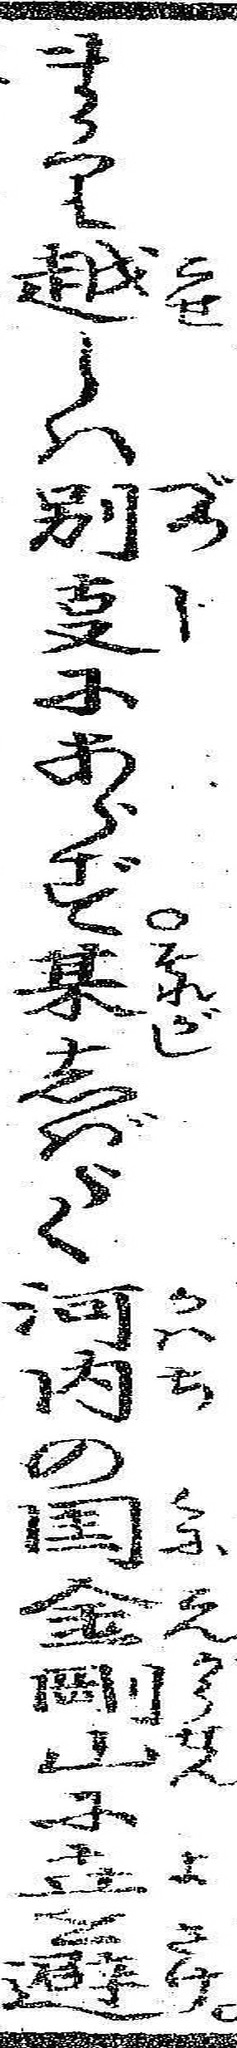まかり越しは別事にあらず。某しばらく河内の国金剛山に世を避。
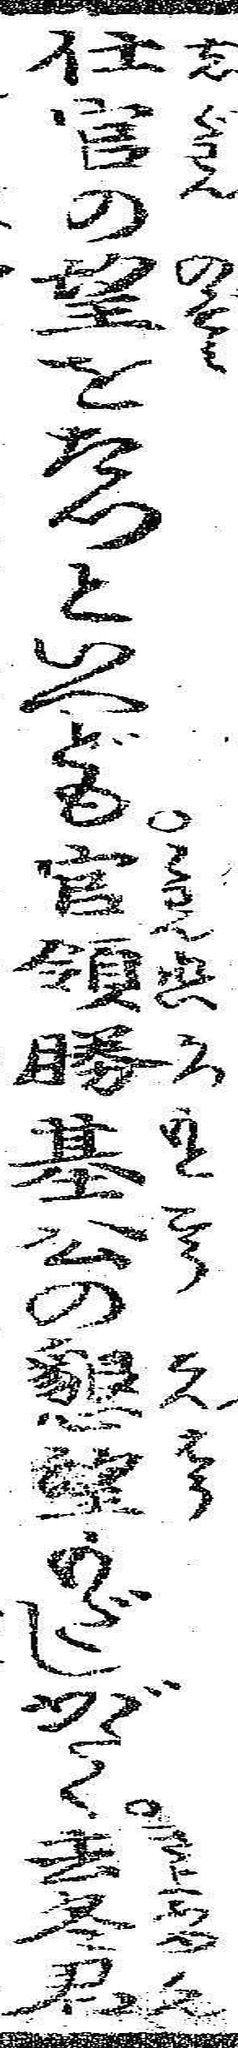仕官の望をたつといへども。官領勝基公の懇望もだしがたく。去冬君
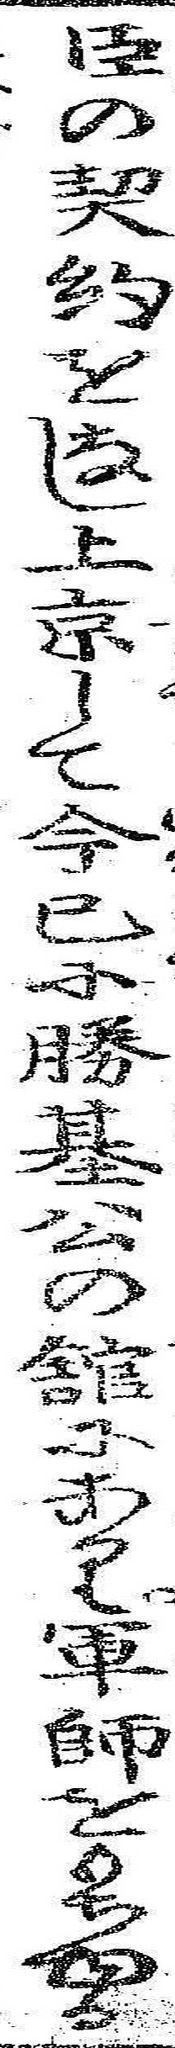臣の契約をなし。上京して今已に勝基公の館にあり。軍師をもちゆる
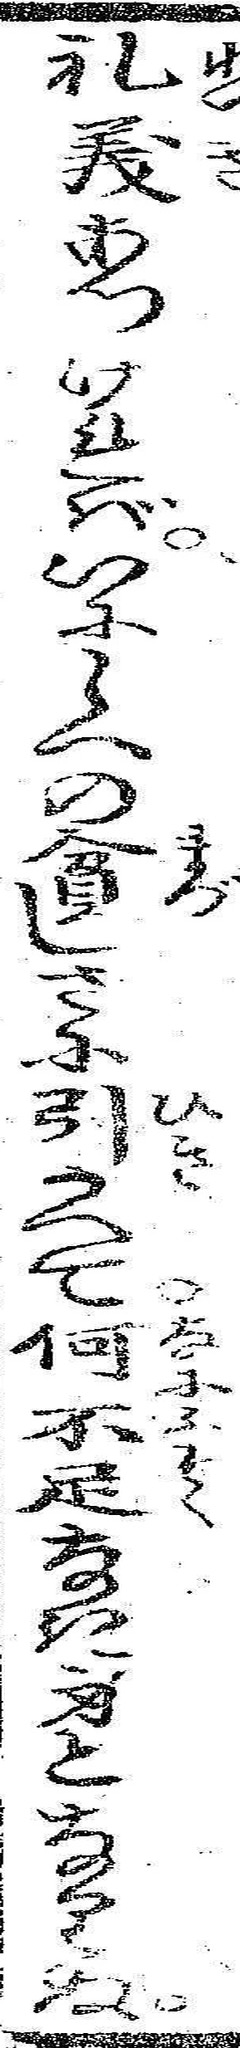礼義あつければ。いにしへの貧しさに引かへて。何不足なき身となりぬ。

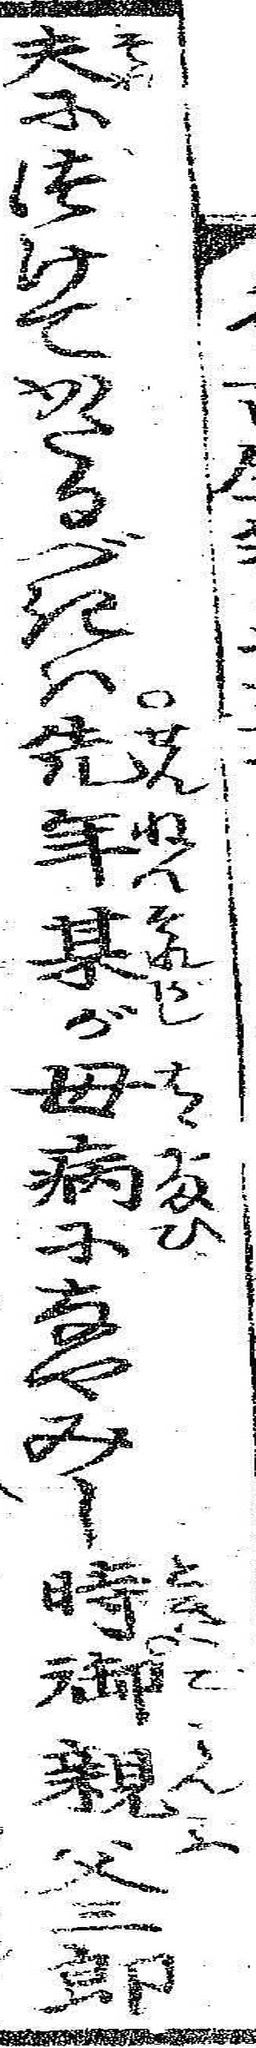夫につけてかたるべきは。先年某が母病になやみし時。御親父三郎
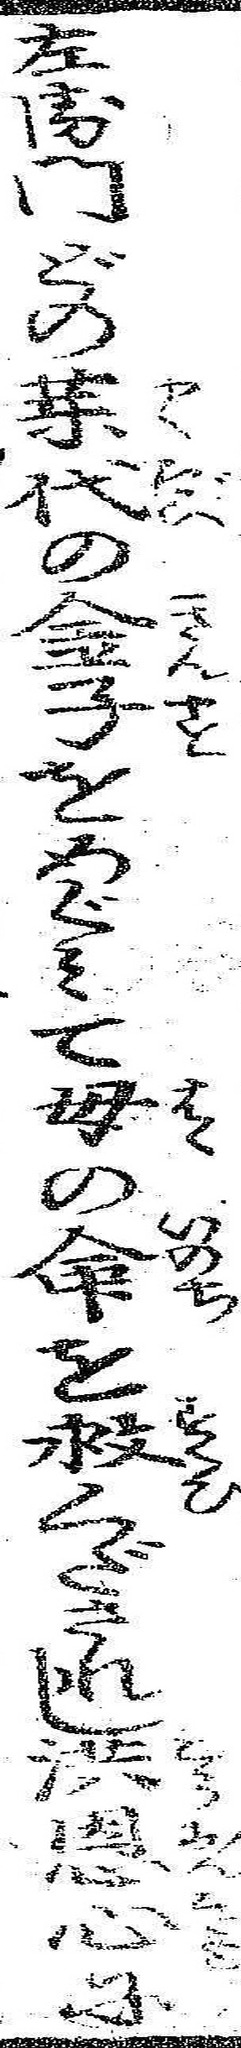左衛門どの薬代の金子をめぐみて母の命を救くだされし洪恩心に
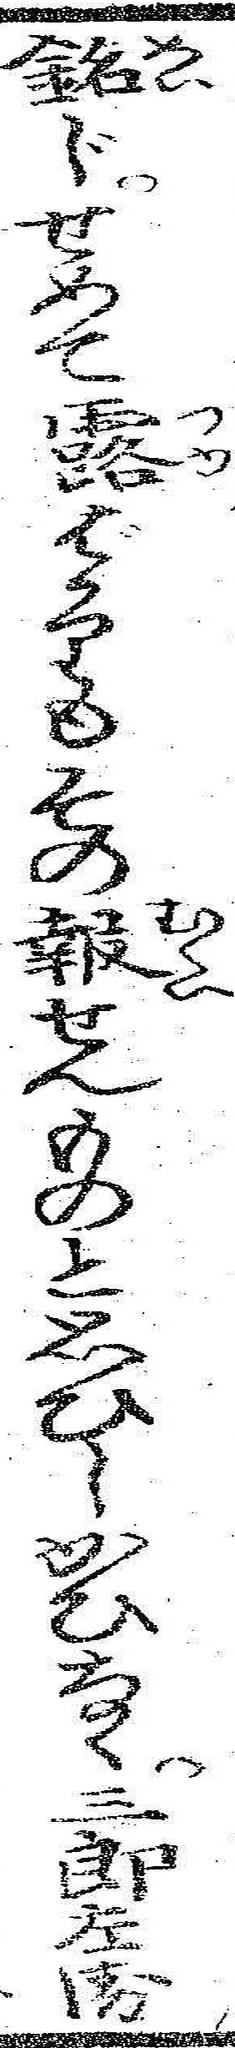銘じ。せめて露ばかりもその報せんものと思ひしかひなく。三郎左衛
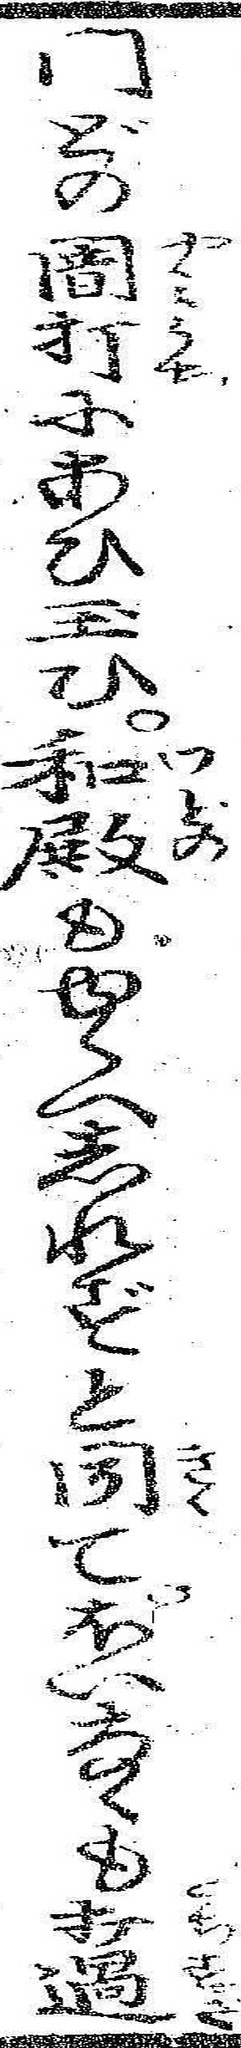門どの闇打にあひ玉ひ。和殿もゆくへしれずと聞て。ほいなくも打過
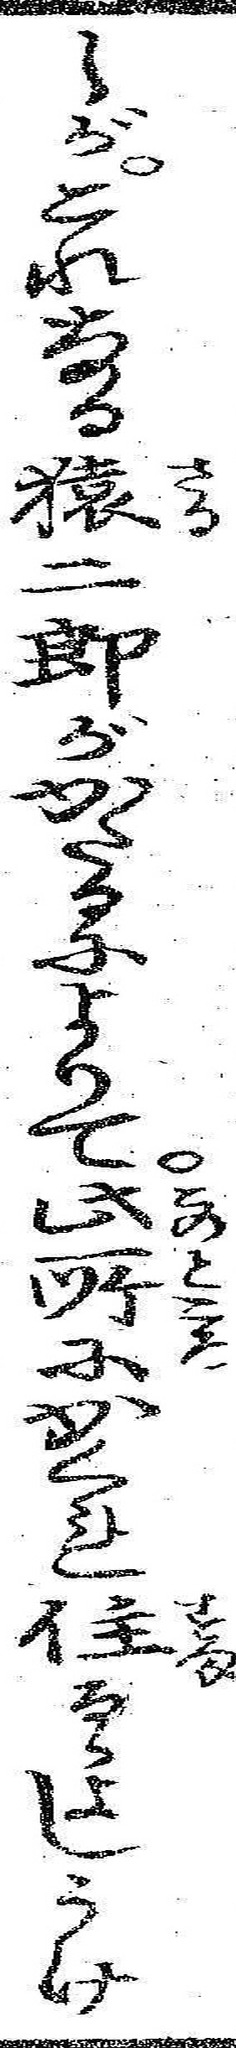しが。これなる猿二郎がかたるによりて。此所にかくれ住るゝよしうけ
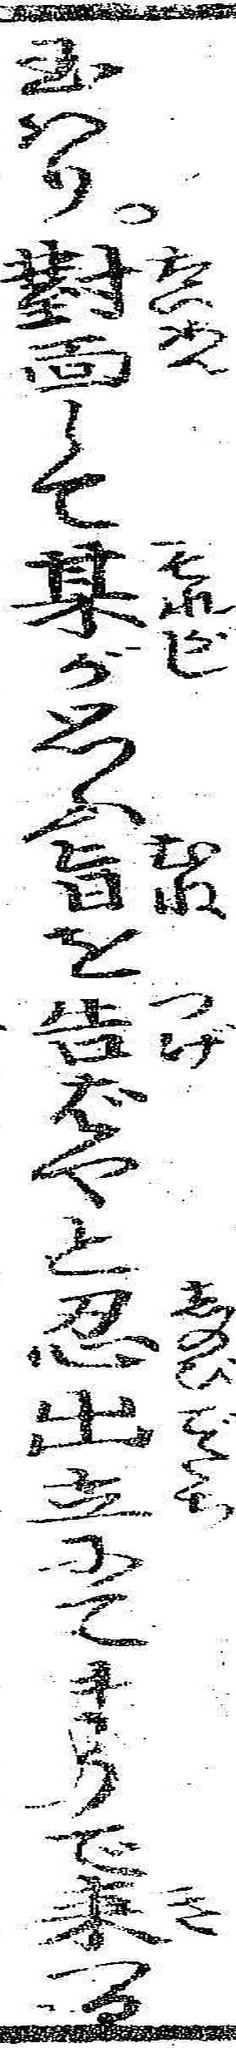玉はり。対面して某が思ふ旨を告ばやと忍出立にてまかりで来つる
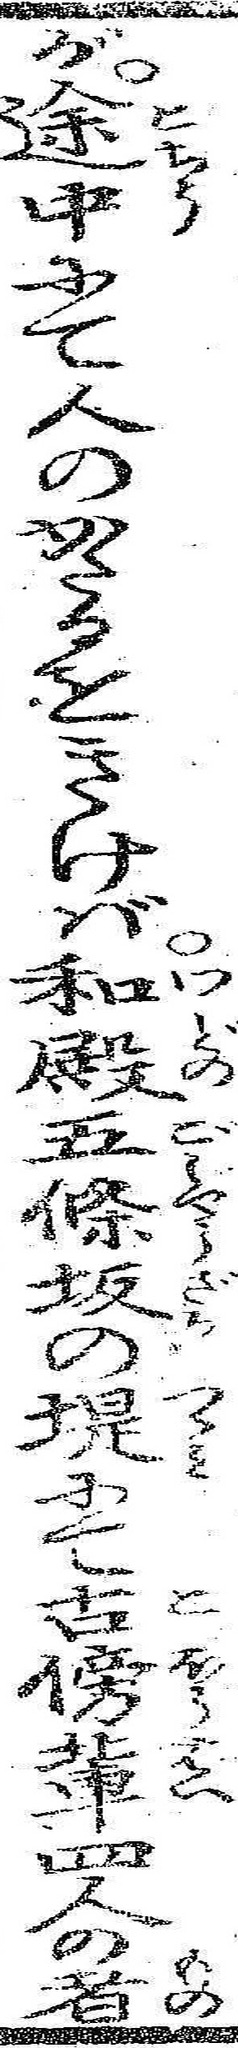が。途中にて人のかたるをきけば。和殿五条坂の堤にて古傍輩四人の者
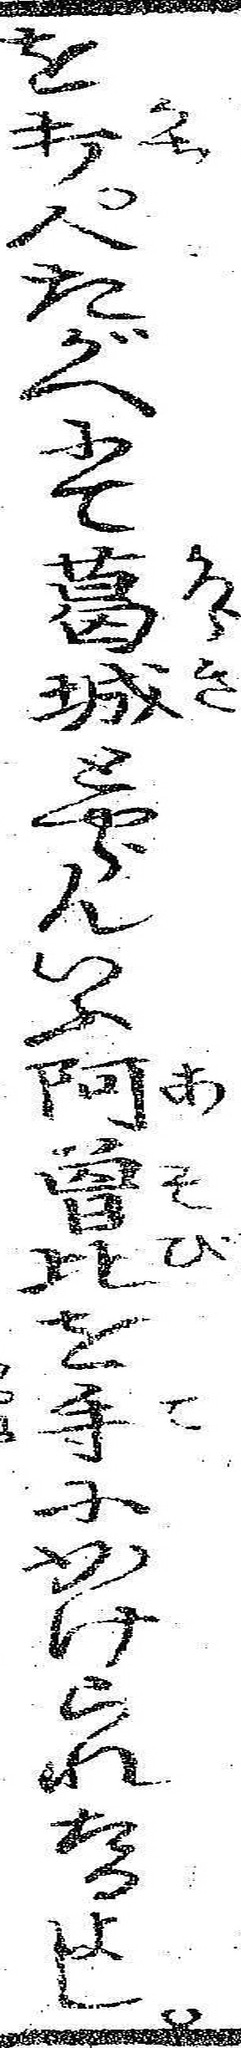を打。人たがへにて葛城とやらんいふ阿曽比を手にかけられたるよし。
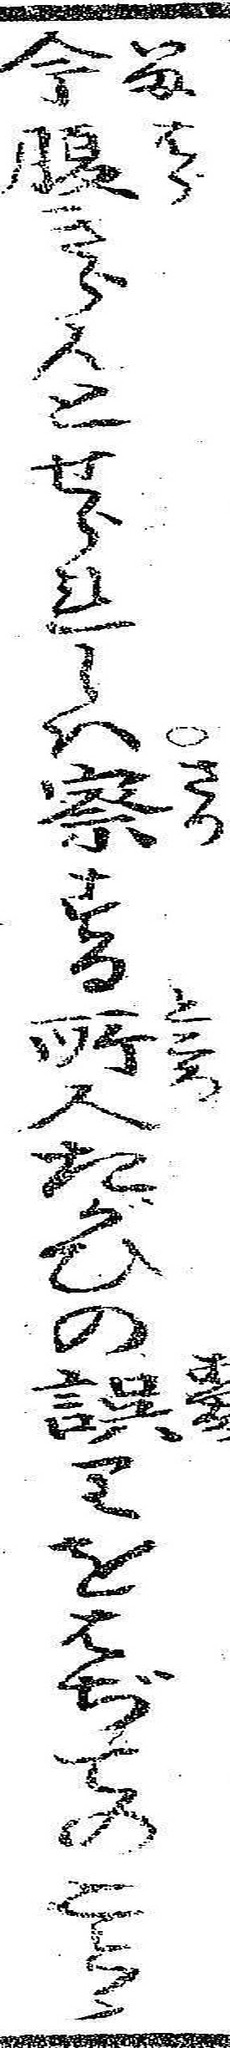今腹きらんとせられしは。察する所人たがひの誤りをはぢてのことゝ
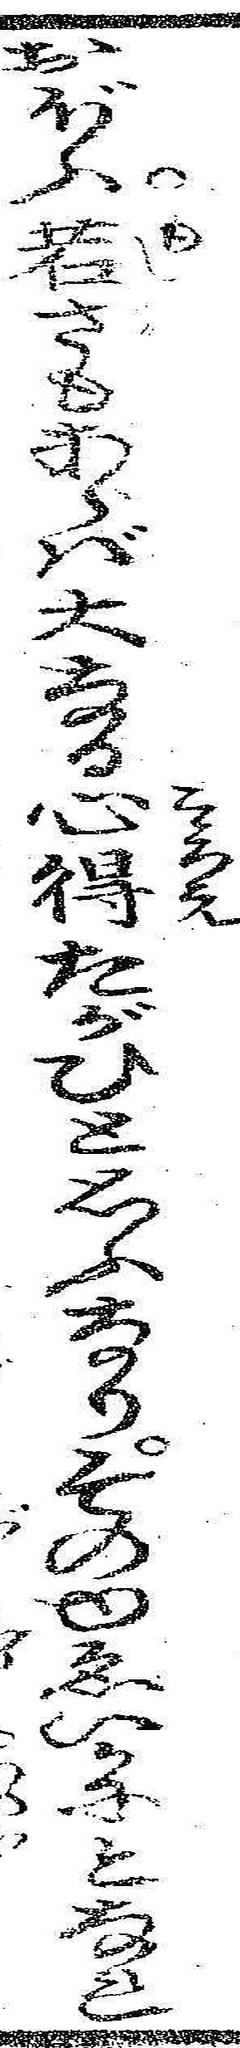おぼふ。若さもあらば大なる心得たがひと思ふなり。そのゆゑいかにとなれ
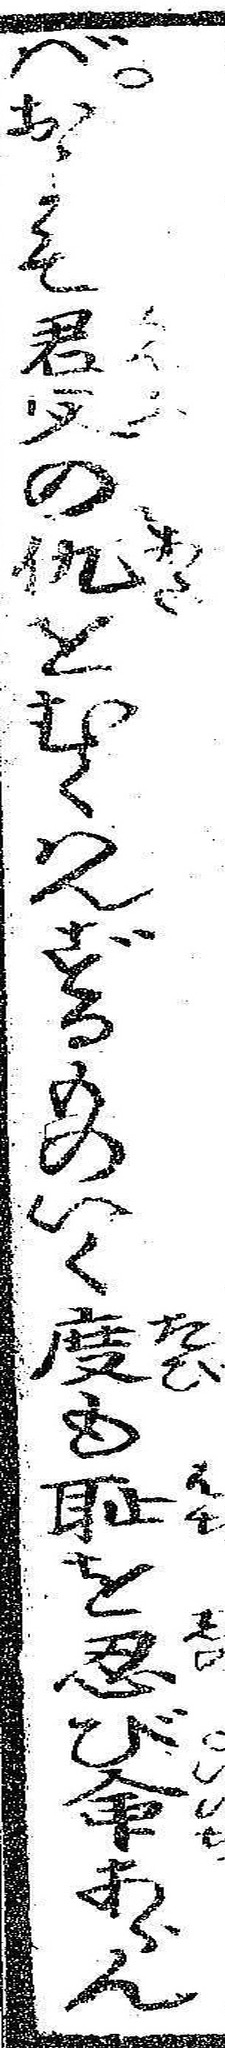ば。おゝよそ君父の仇をむくはんずるものいく度も恥を忍び。命あらん
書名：昔話稲妻表紙
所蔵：国文学研究資料館
